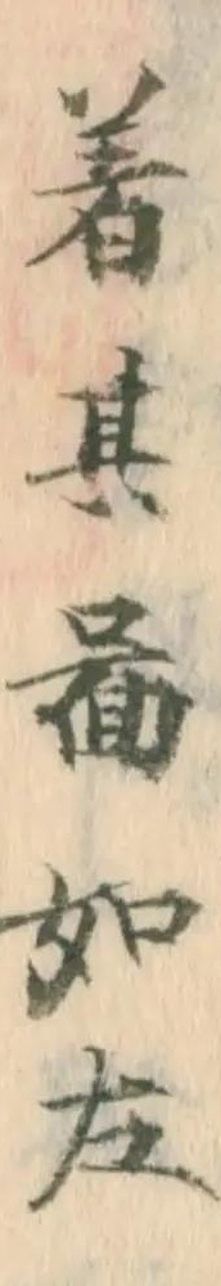着其図如左
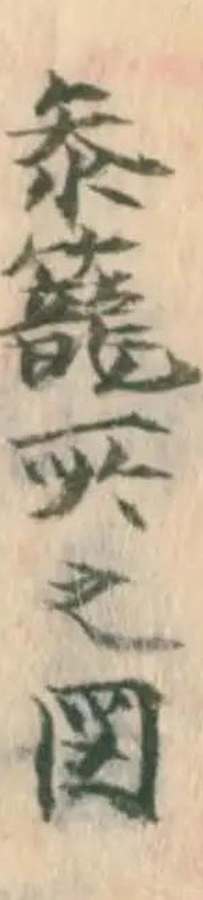参籠所之図
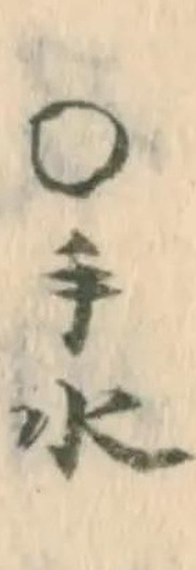○手水
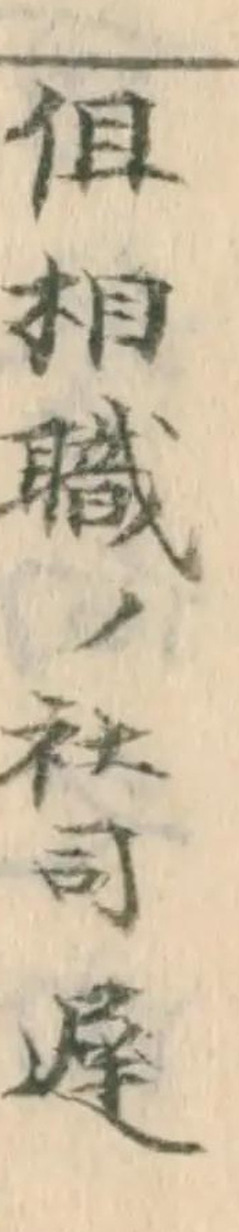但相職ノ社司遅
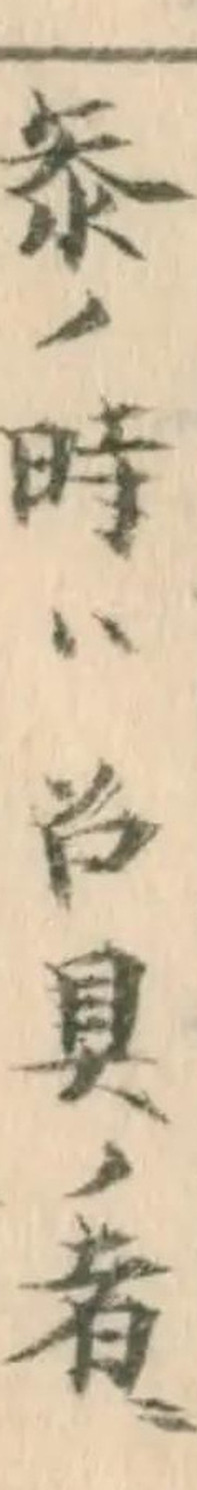参ノ時ハ召具ノ者ニ
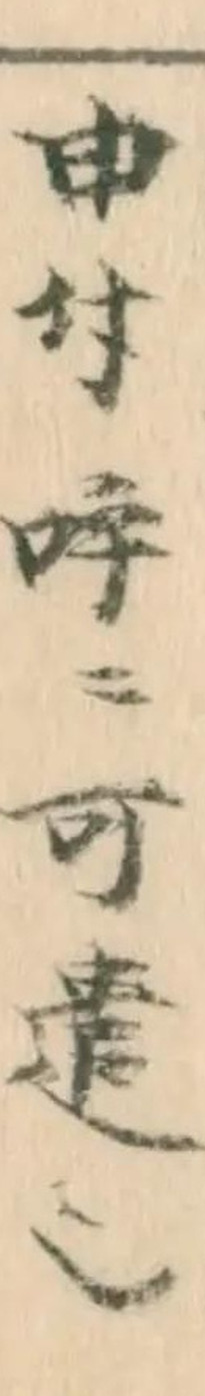申付呼ニ可遣也
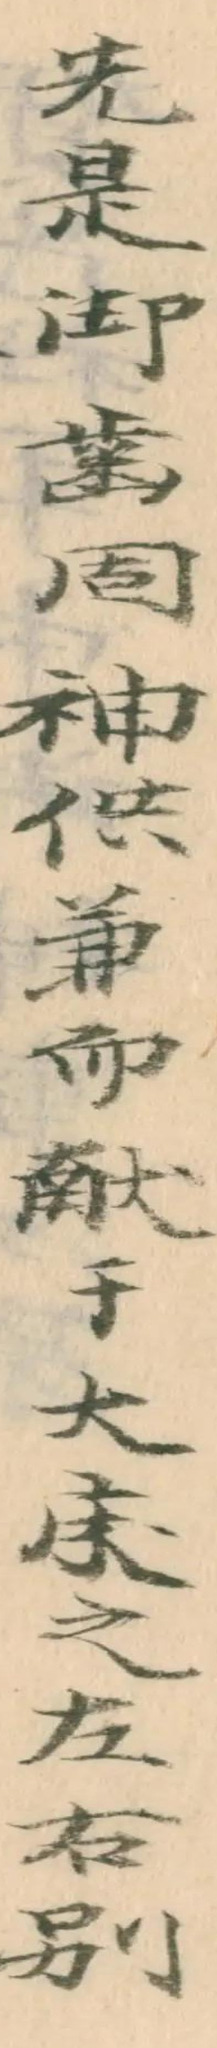先是御歯固神供兼而献于大床之左右別
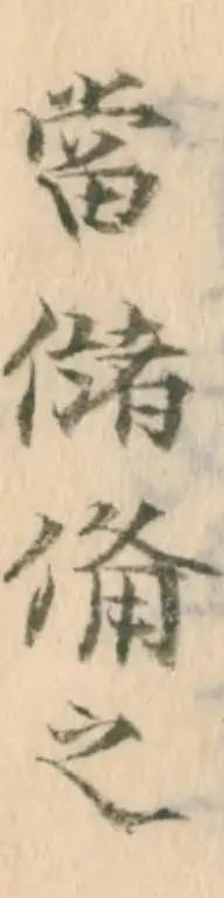当儲備之
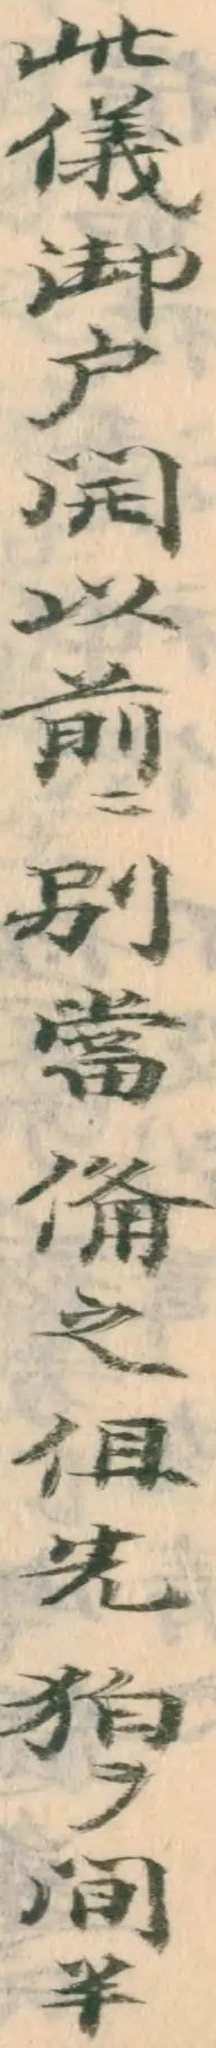此儀御戸開以前ニ別当備之但先狛ヲ間半
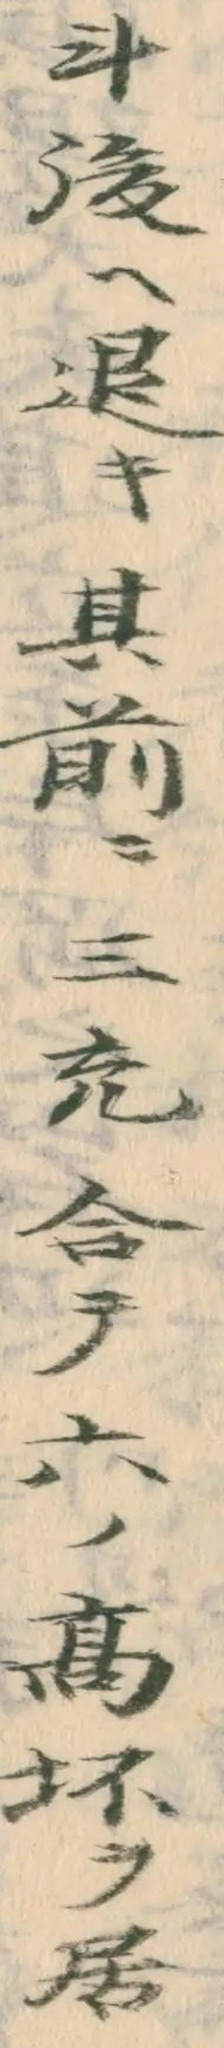斗後ヘ退キ其前ニ三充合テ六ノ高坏ヲ居
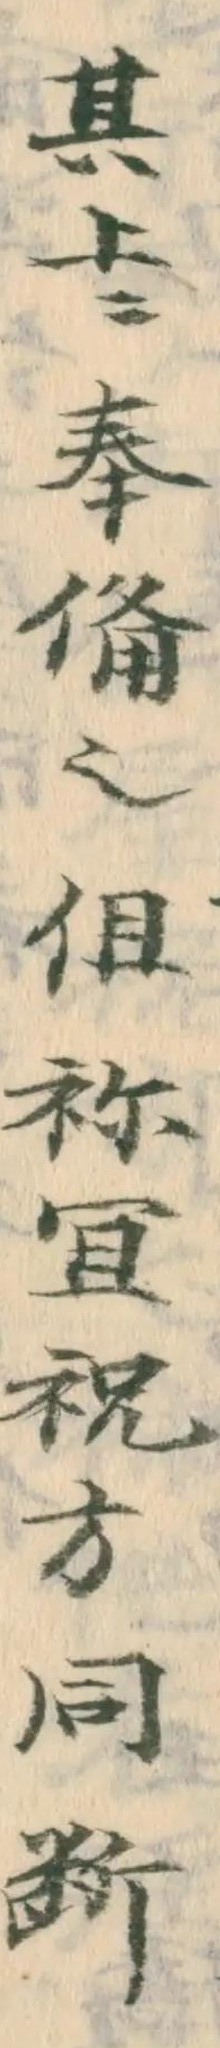其上ニ奉備也但祢宜祝方同断
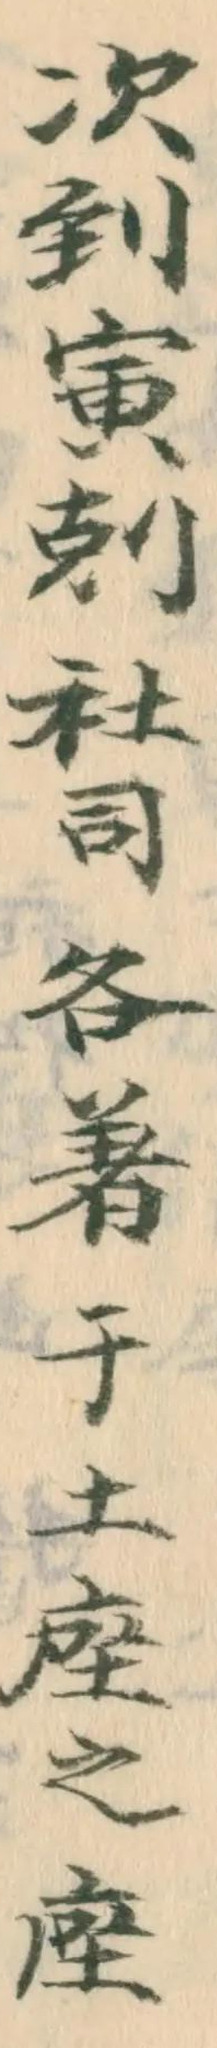次到寅剋社司各着于土座之座
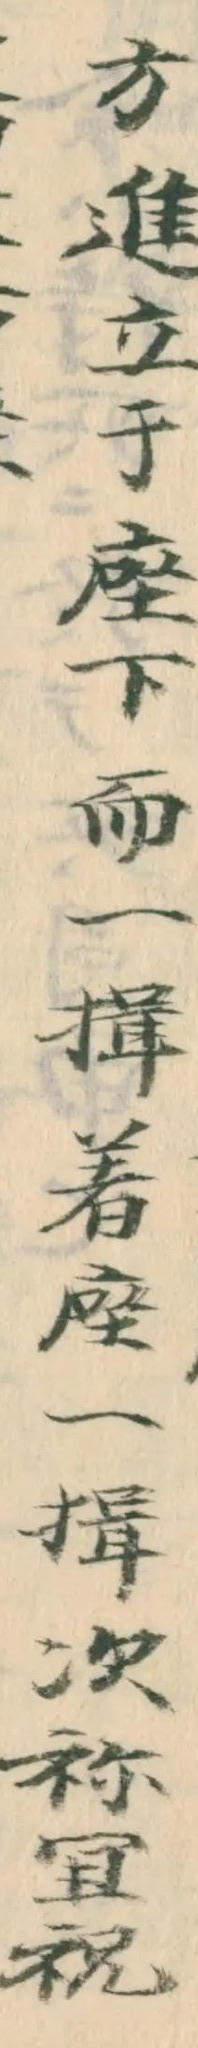方進立于座下而一揖着座一揖次祢宜祝
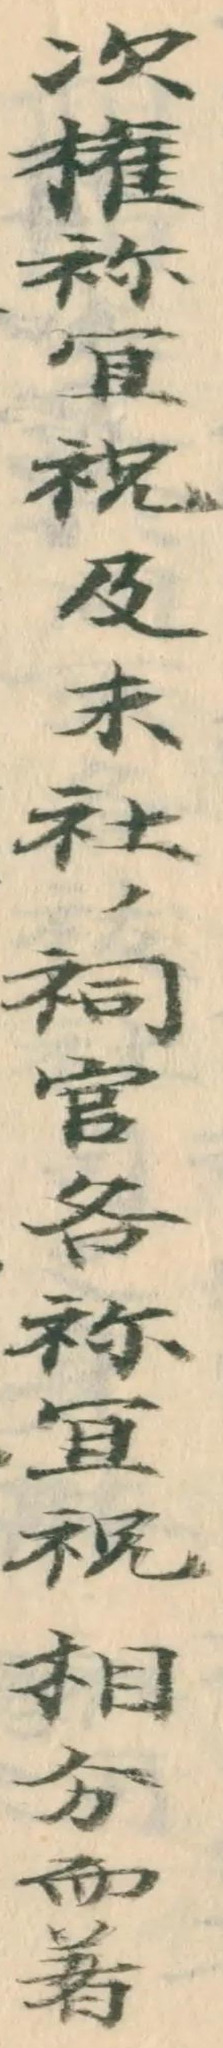次権祢宜祝及末社ノ祠官各祢宜祝相分而着
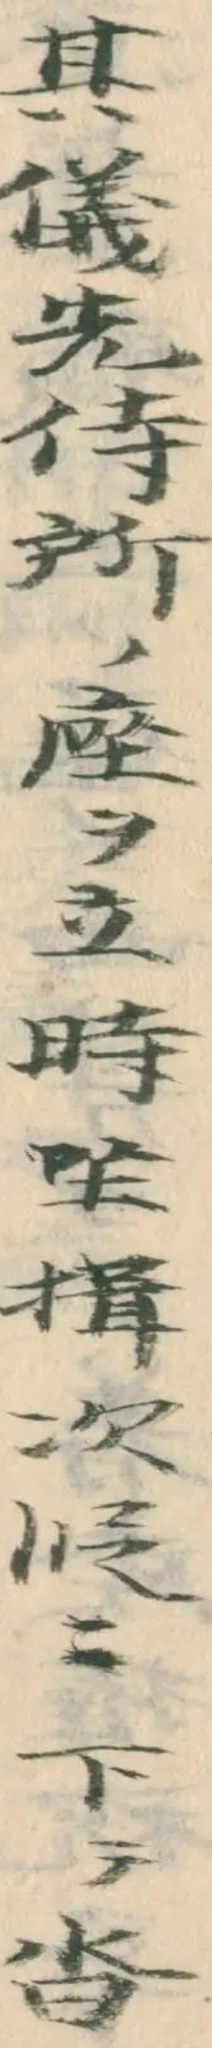其儀先侍所ノ座ヲ立時座揖次段々下テ沓
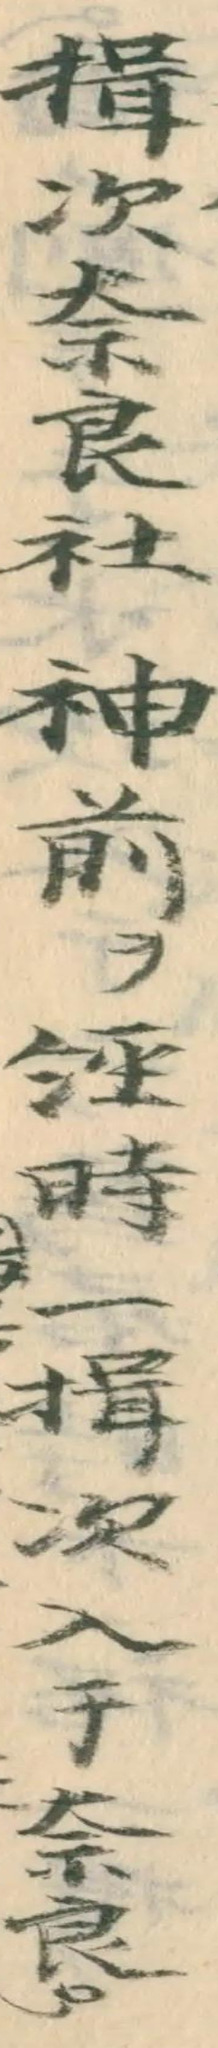揖次奈良社神前ヲ経時一揖次入于奈良◦
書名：賀茂社記録. 第5冊
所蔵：国立国会図書館 National Diet Library, JAPAN
